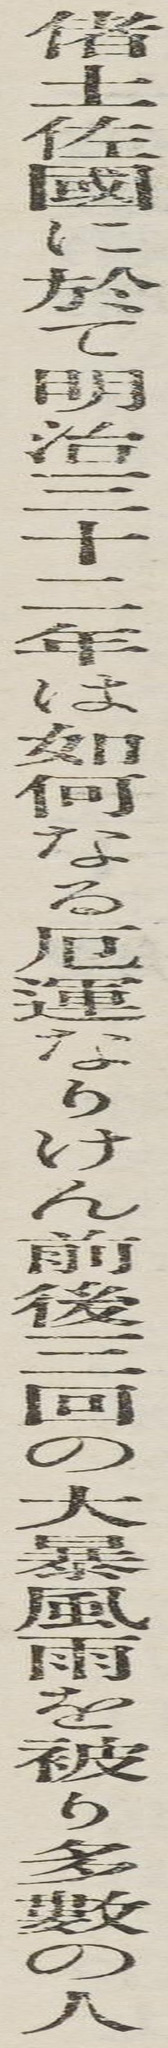偖土佐国に於て明治三十二年は如何なる厄運なりけん前後三回の大暴風雨を被り多数の人
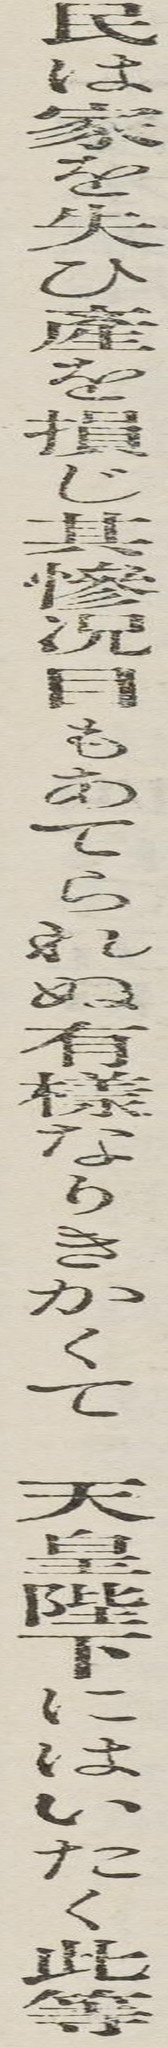民は家を失ひ産を損じ其惨况目もあてられぬ有様なりきかくて天皇陛下にはいたく此等
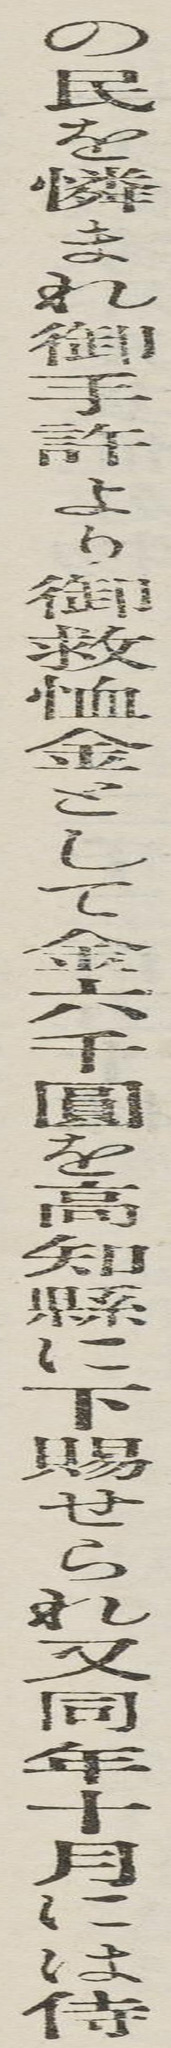の民を憐まれ御手許より御救恤金として金六千円を高知県に下賜せられ又同年十月には侍
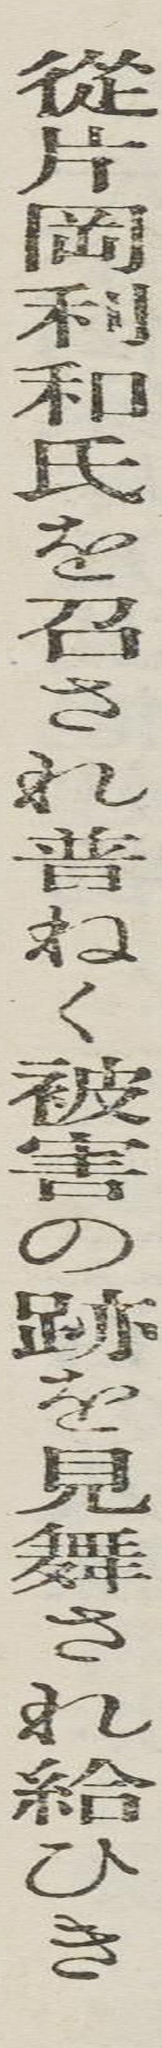従片岡利和氏を召され普ねく被害の跡を見舞され給ひき
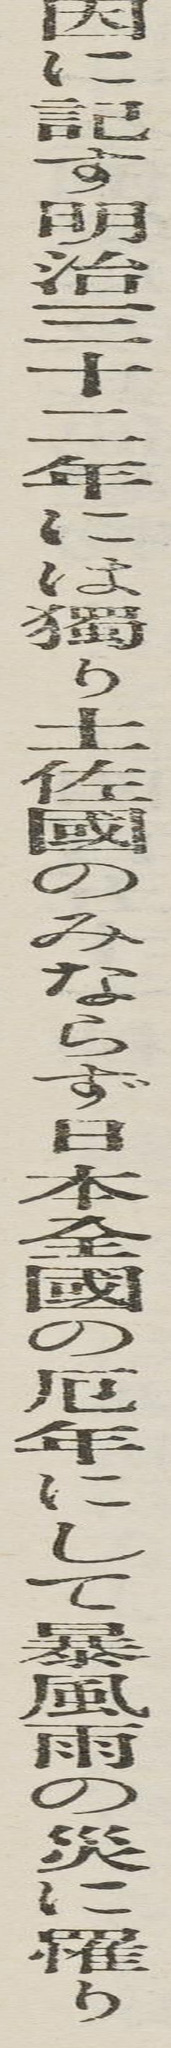因に記す明治三十二年には独り土佐国のみならず日本全国の厄年にして暴風雨の災に罹り
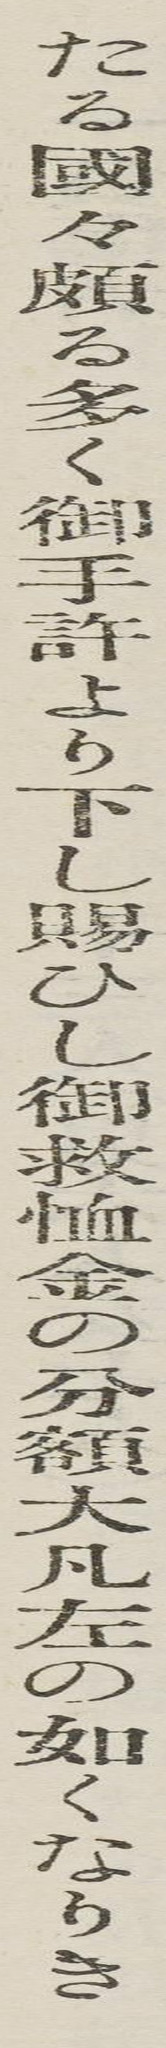たる国々頗る多く御手許より下し賜ひし御救恤金の分額大凡左の如くなりき
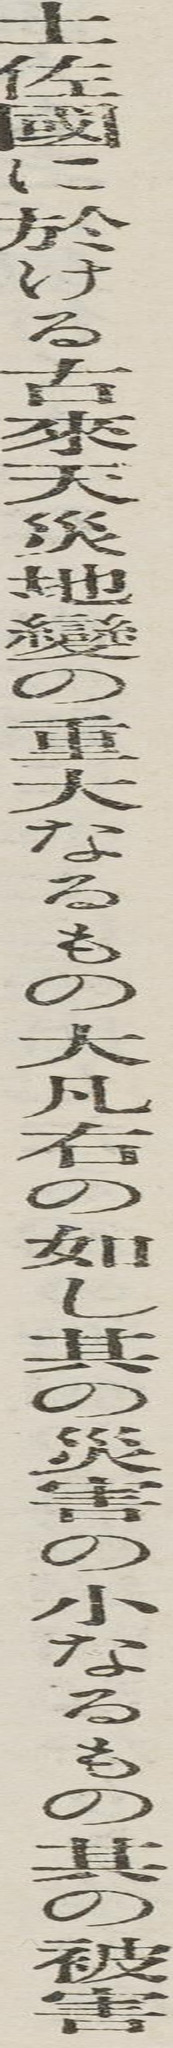土佐国に於ける古来天災地変の重大なるもの大凡右の如し其の災害の小なるもの其の被害
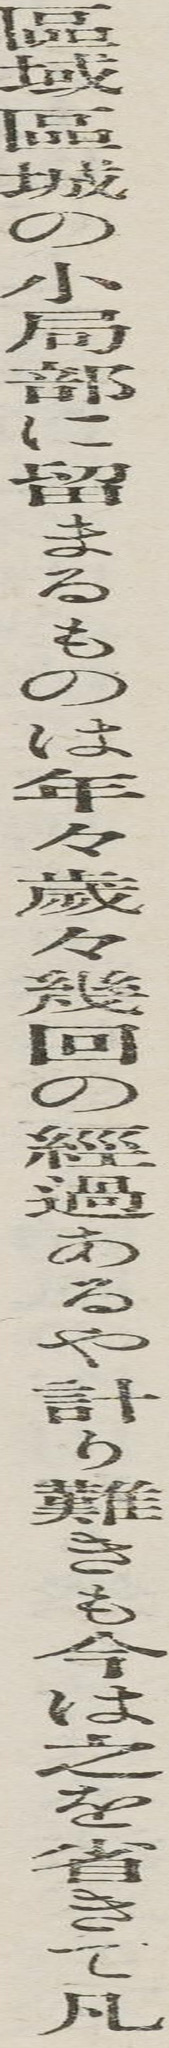区域区域の小局部に留まるものは年々歳々幾回の経過あるや計り難きも今は之を省きて凡
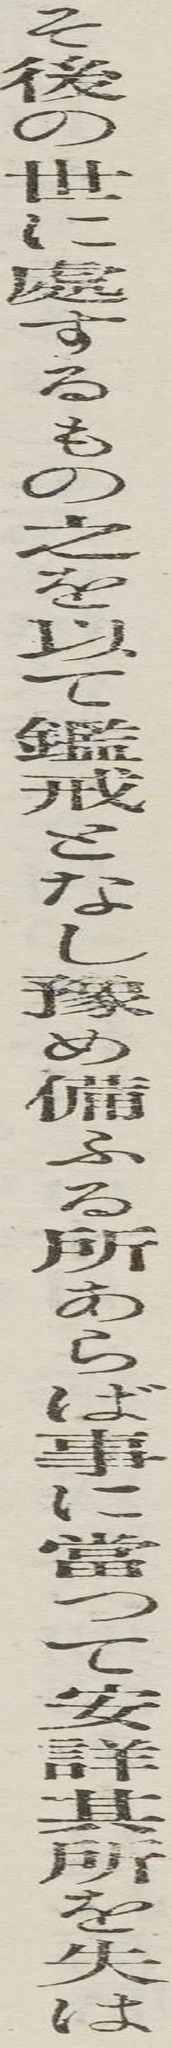そ後の世に処するもの之を以て鑑戒となし予め備ふる所あらば事に当って安詳其所を失は
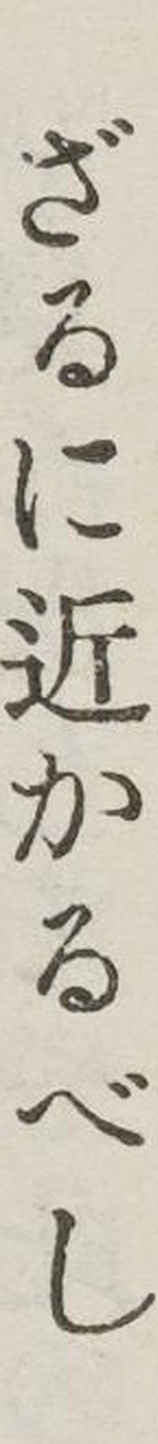ざるに近かるべし
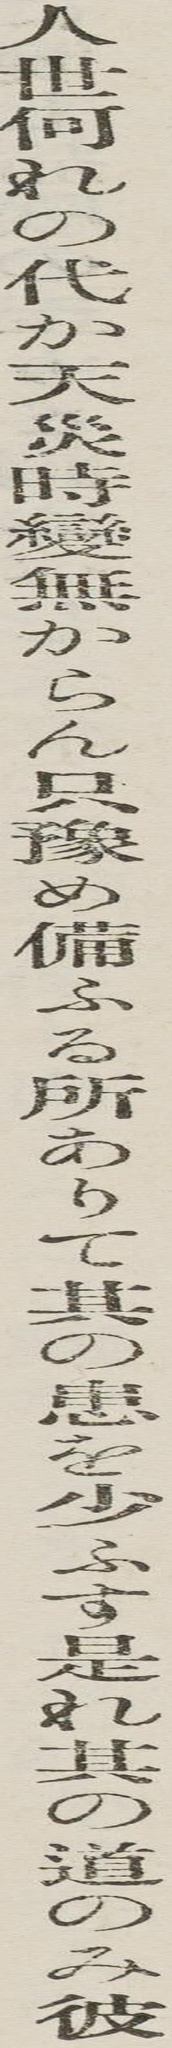人世何れの代か天才事変無からん只予め備ふる所ありて其の患を少ふす是れ其の道のみ彼
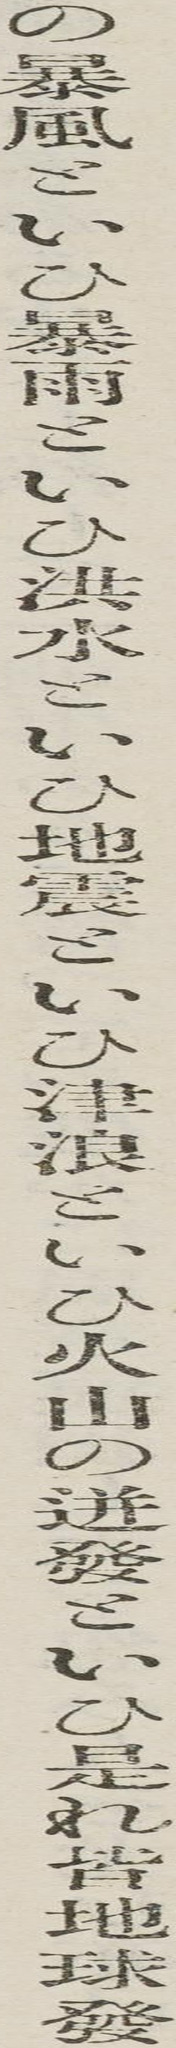の暴風といひ暴雨といひ洪水といひ地震といひ津浪といひ火山の迸発といひ是れ皆地球発
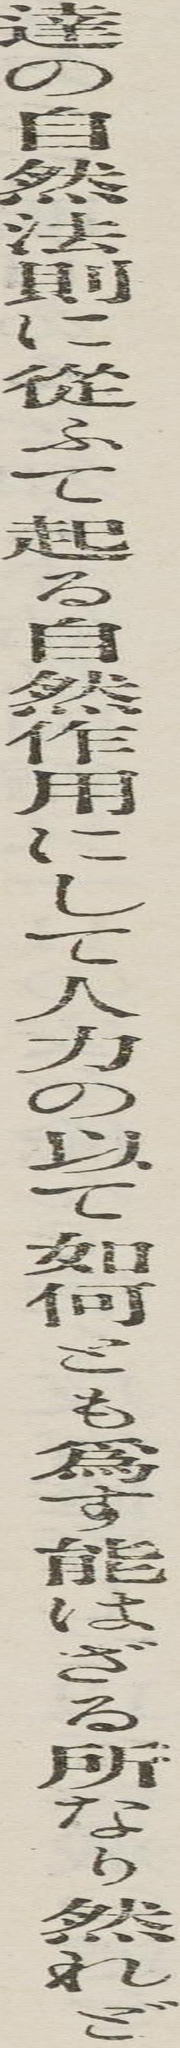達の自然法則に従ふて起る自然作用にして人力の以て如何とも為す能はざる所なり然れど
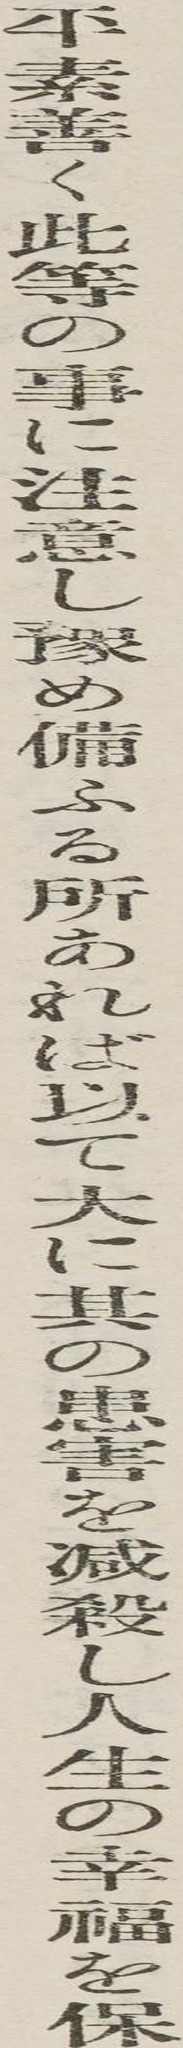平素善く此等の事に注意し予め備ふる所あれば以て大に其の患害を減殺し人生の幸福を保
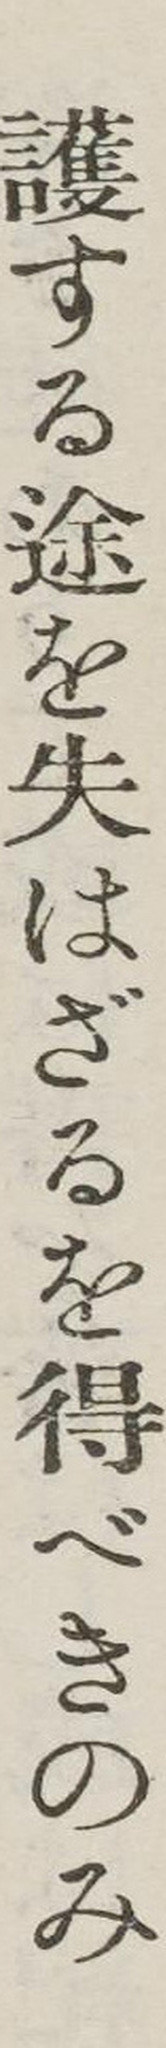護する途を失はざるを得べきのみ
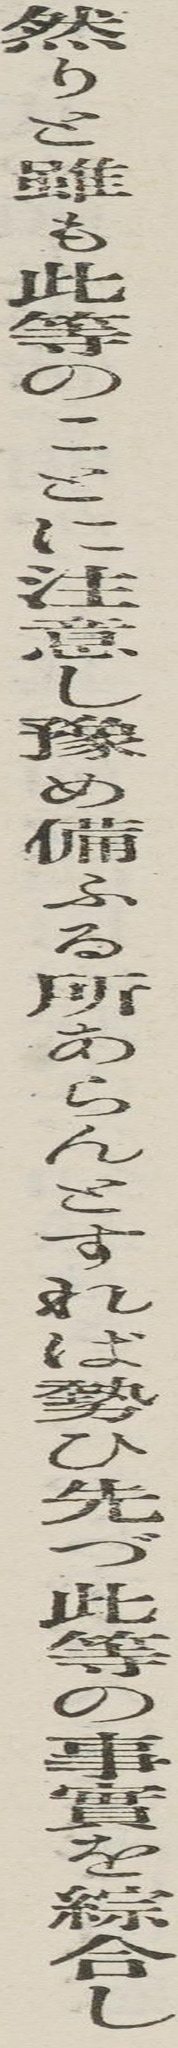然りと雖も此等のことに注意し予め備ふる所あらんとすれば勢ひ先づ此等の事実を総合し
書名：土佐古今ノ地震
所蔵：東京大学地震研究所図書室 Earthquake Research Institute Library, The University of Tokyo, JAPAN
